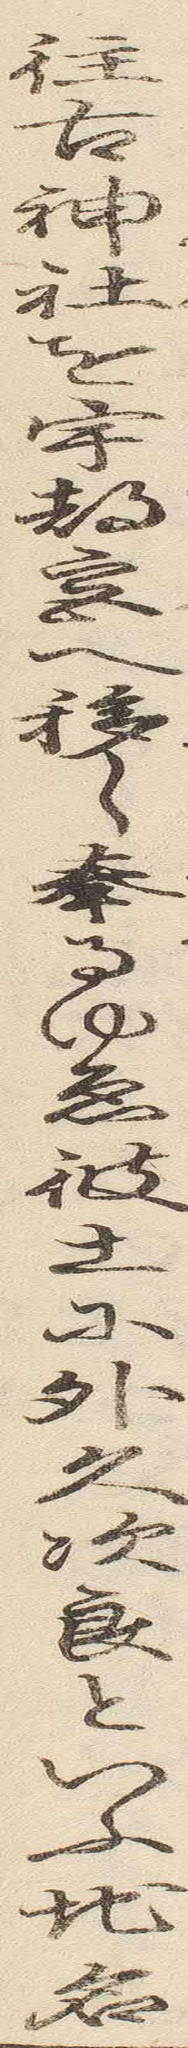往古神社を宇都宮へ移し奉るゆゑ彼土に外久次良といふ地名
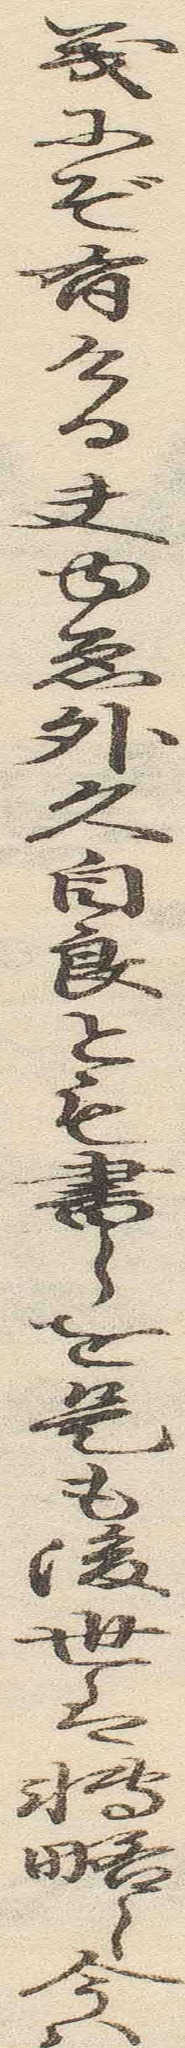義にぞ有ける夫ゆゑ外久自良とも書しを是も後世は轉略し今は
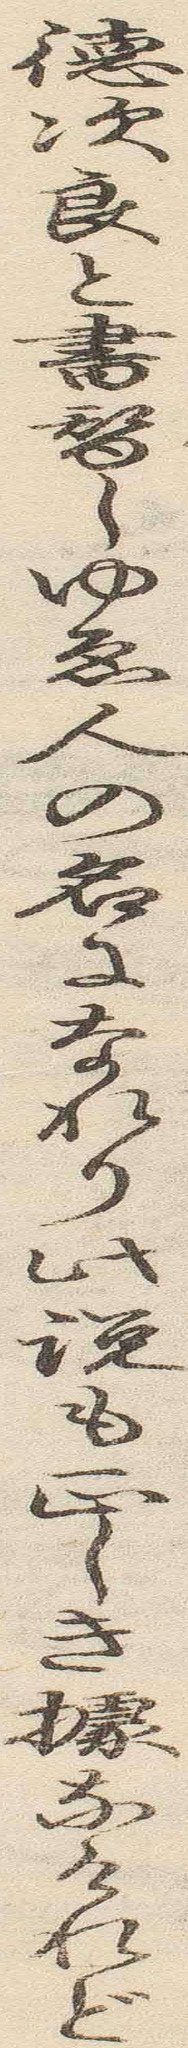德次良と書替しゆゑ人の名になれり此説も正しき據なけれど
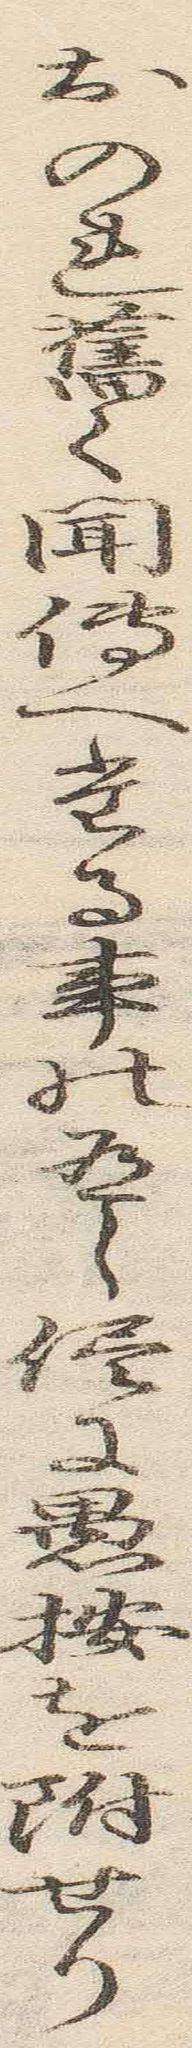おのれ𦾔く聞傳へたる事の有し侭に愚按を附せり
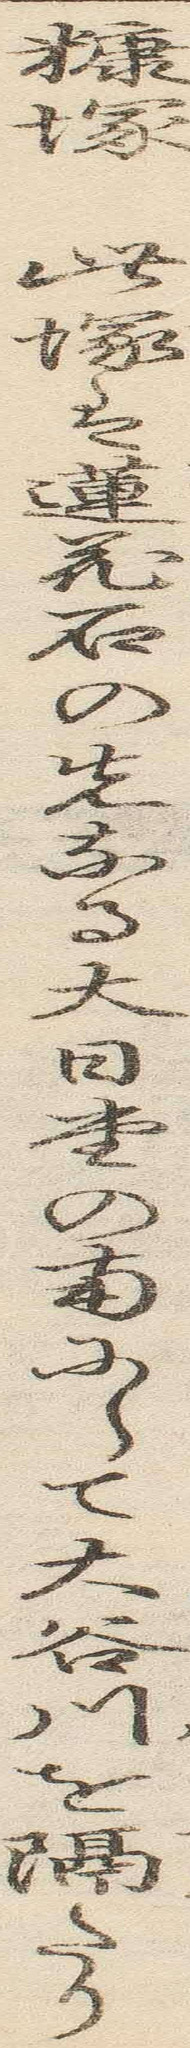糠塚此塚は蓮花石の先なる大日堂の南にして大谷川を隔たり
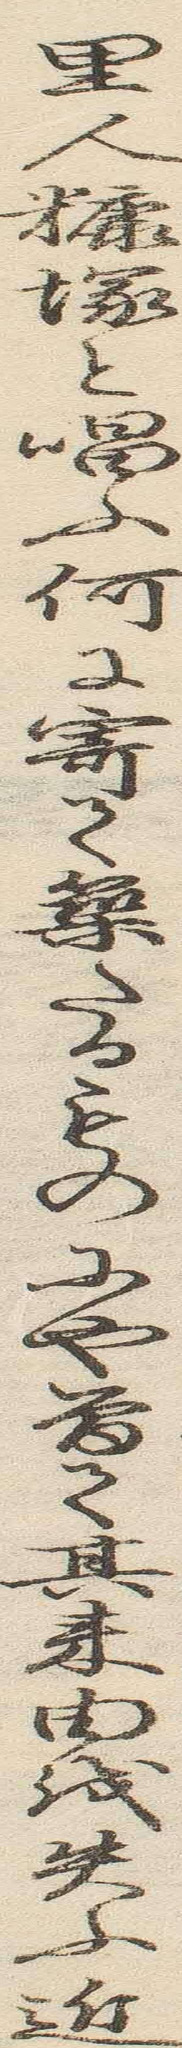里人糠塚と唱ふ何に寄て築たるものにや曽て其來由を失ふ近
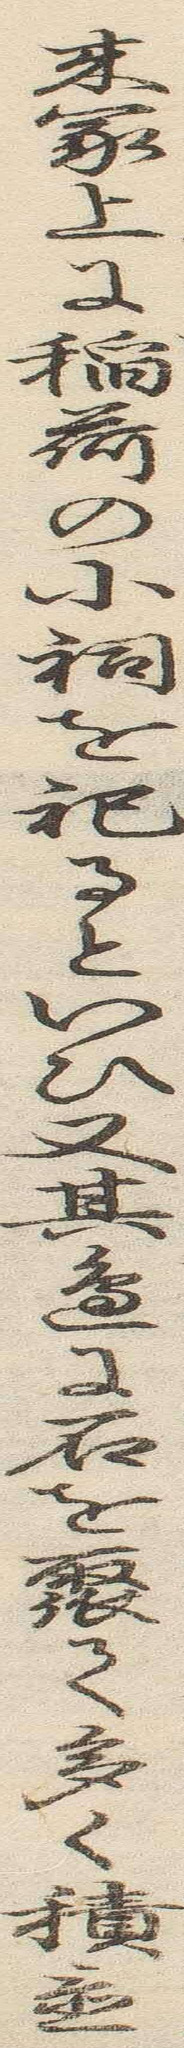來冢上に稲荷の小祠を祀るといひ又其邊に石を聚て多く積置
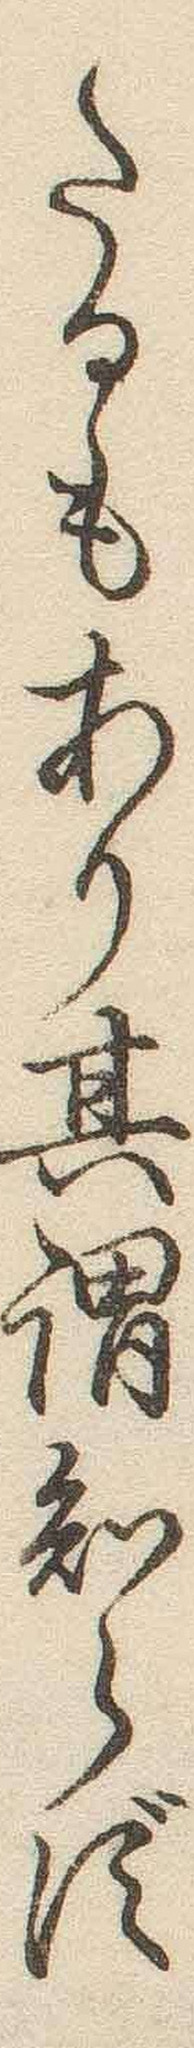たるもあり其謂知らず
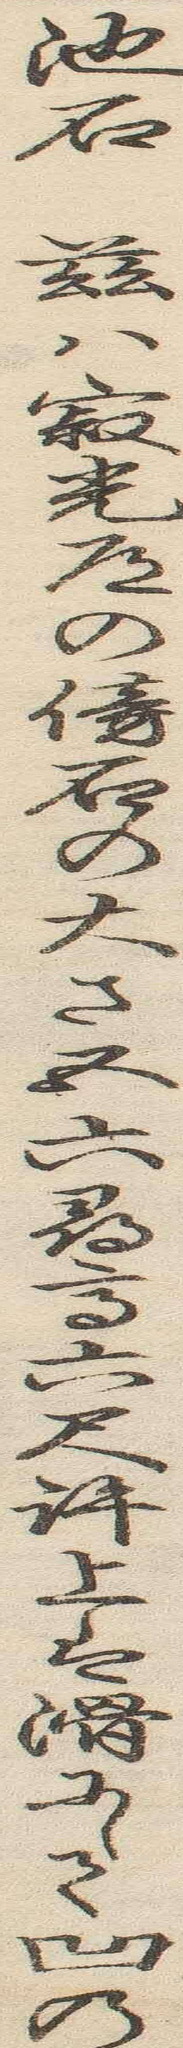池石兹は寂光道の傍石の大さ五六尋高六尺許上は滑にして凹の
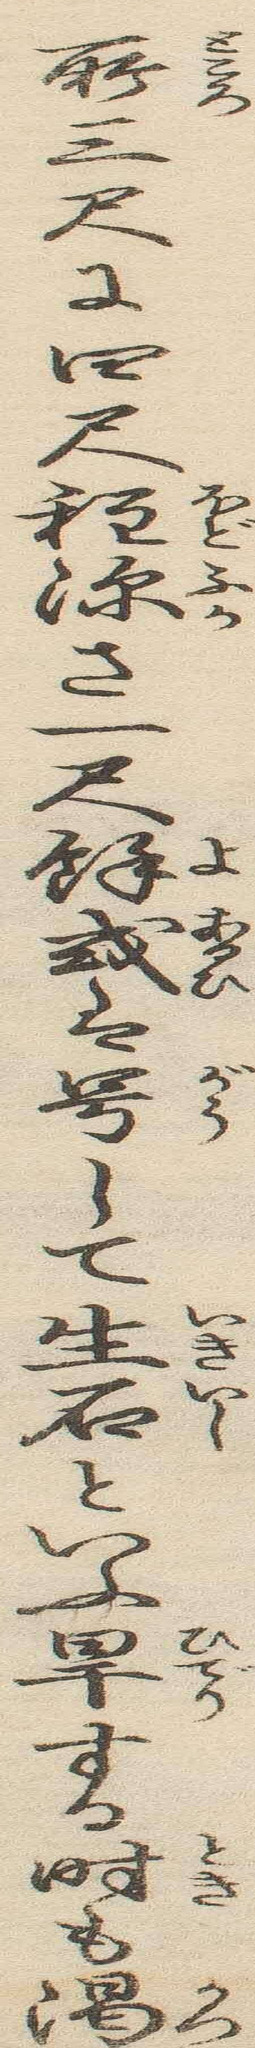所三尺に四尺程深さ一尺餘或は号して生石といふ旱する时も渇
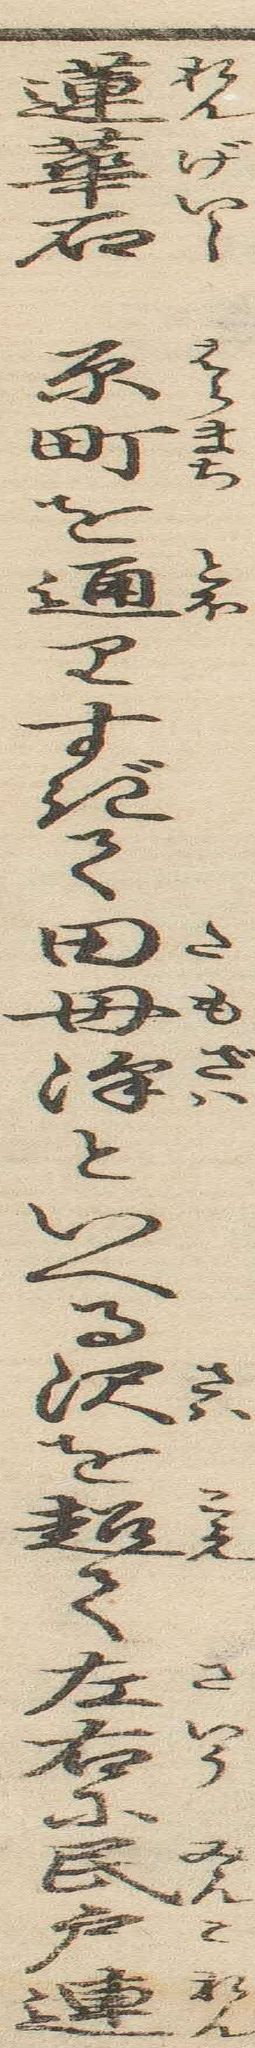蓮蕐石原町を通りすぎて田母澤といへる沢を越て左右に民戸連

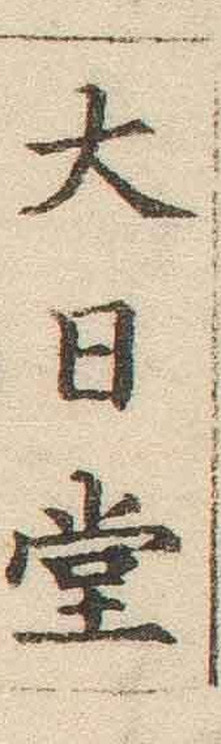大日堂

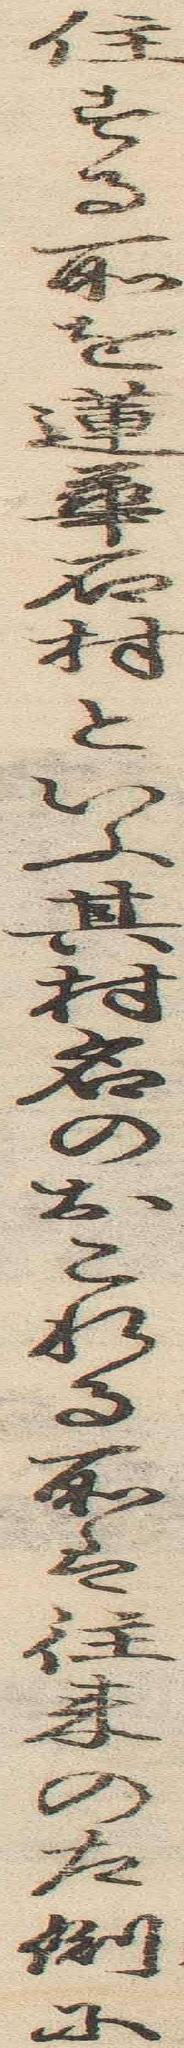住する所を蓮蕐石村といふ其村名のおこれる所は往來の左側に
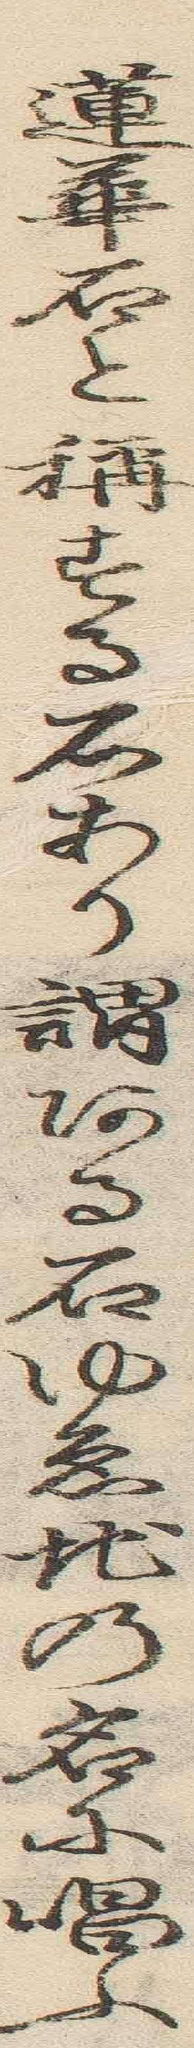蓮蕐石と稱する石あり謂ある石ゆゑ地の名に唱ふ
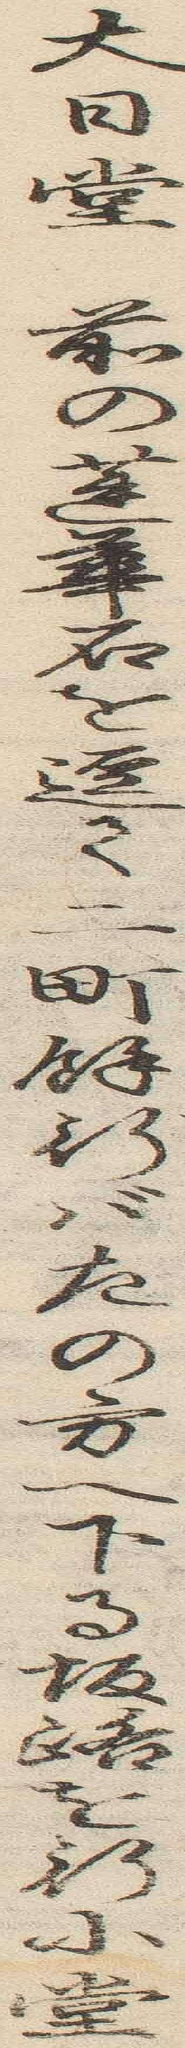大日堂前の蓮蕐石を逕て二町餘行ば左の方へ下る坂路を行小堂
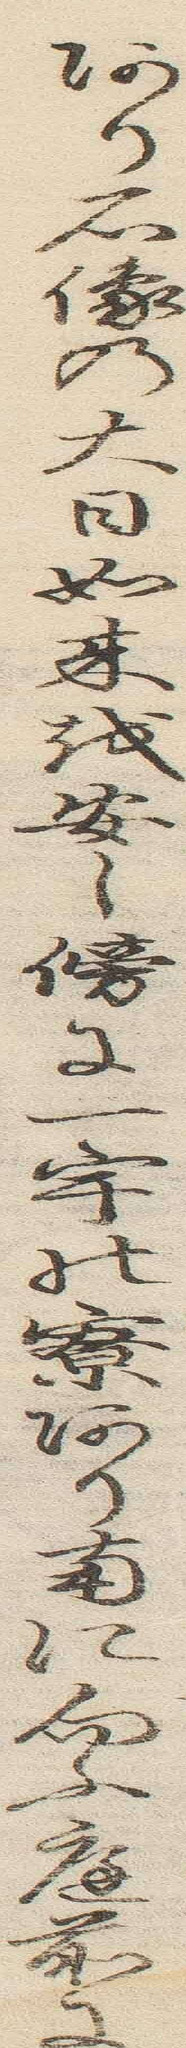あり石像の大日如來を安し傍に一宇の寮あり南に向ふ庭前に
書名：日光山志
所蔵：東京学芸大学附属図書館 国文学研究資料館
